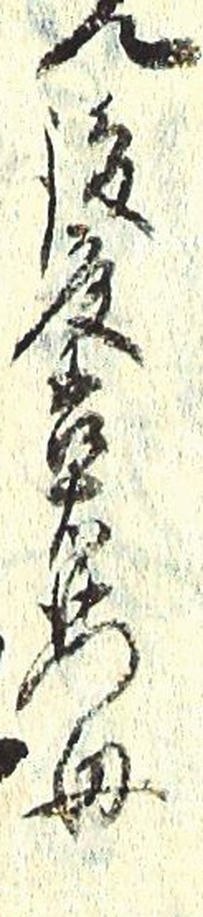後藤善右衛門
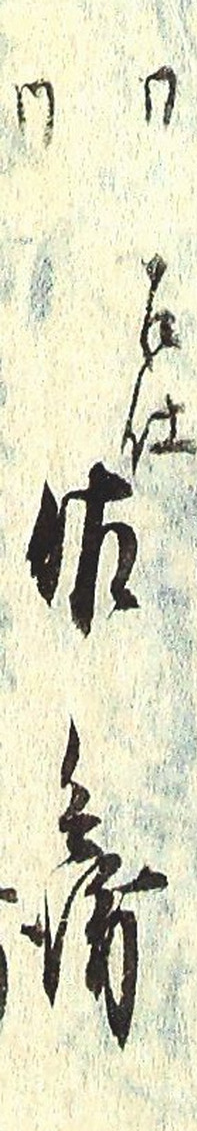同召仕佐兵衛
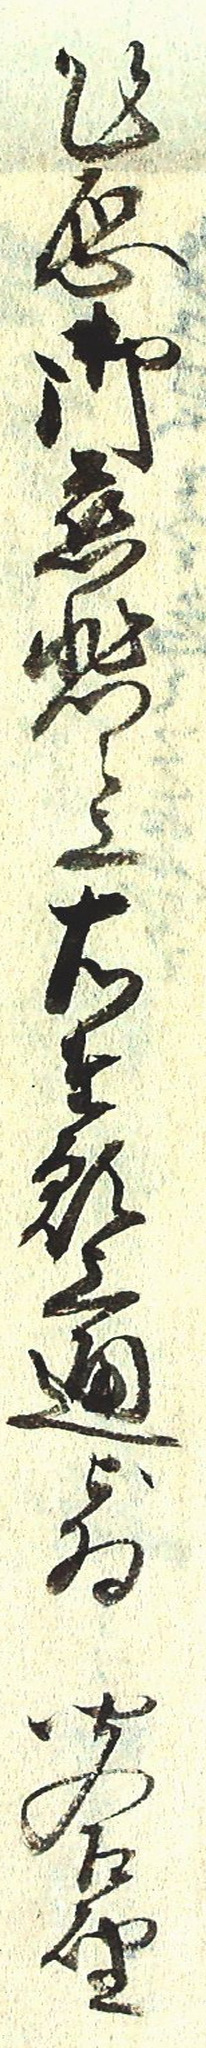乍恐御慈悲之上右奉願上通被為聞召届
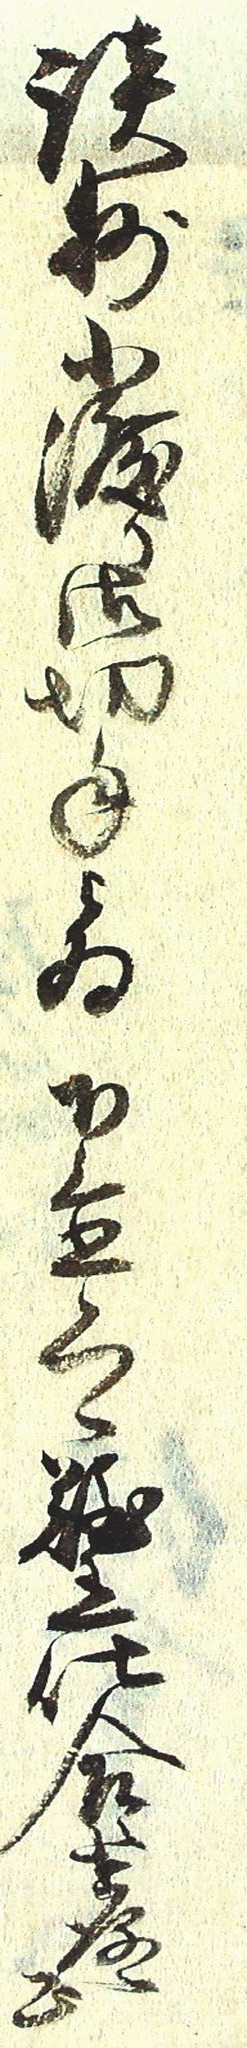淡州小渡り御切手被為下置候はゝ難有仕合に奉存候以上
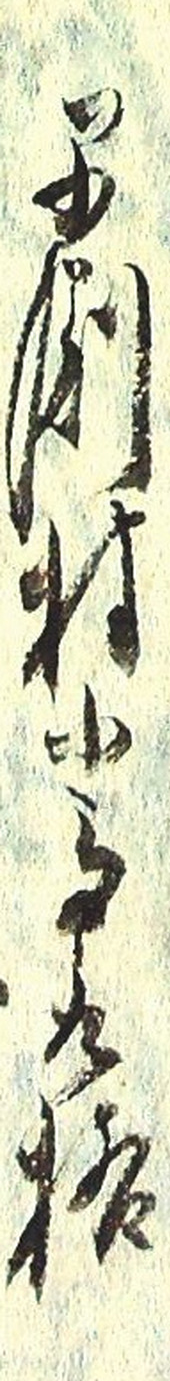早渕村小高取格
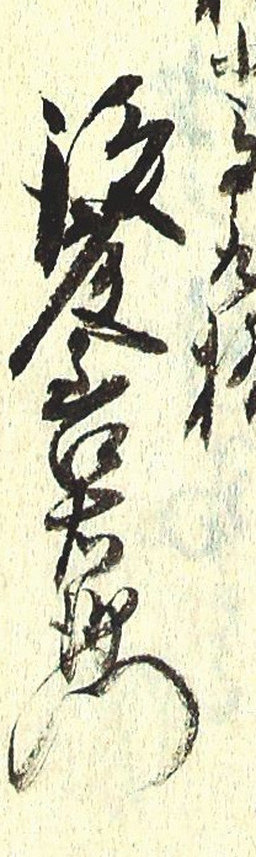後藤善右衛門
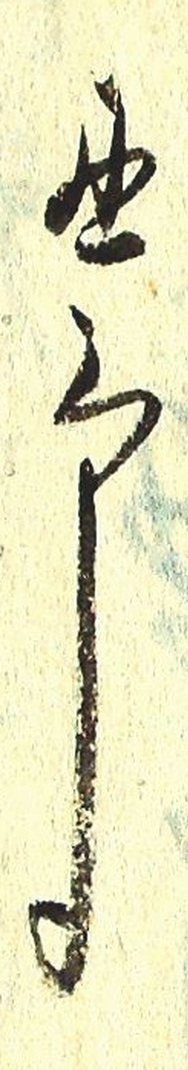丑三月
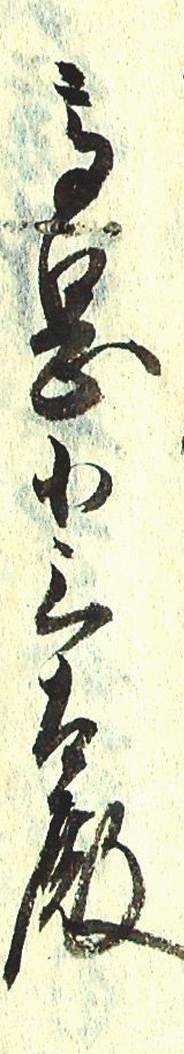高岡小三太殿

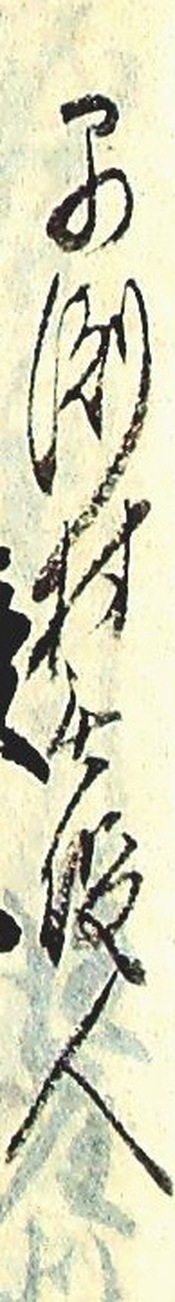早渕村無役人
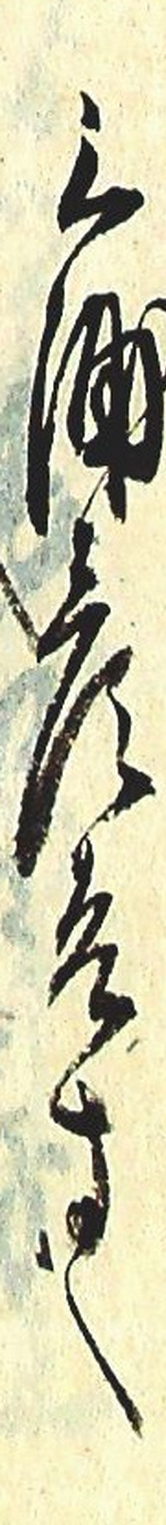三浦彦吉方へ
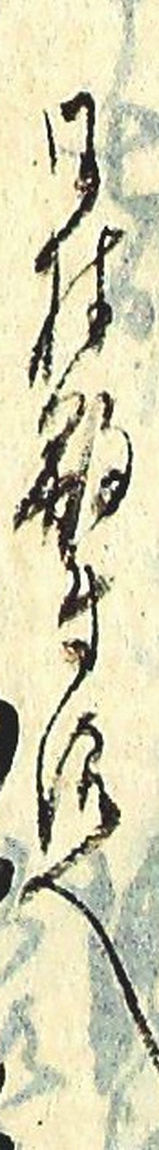同村郡付浪人
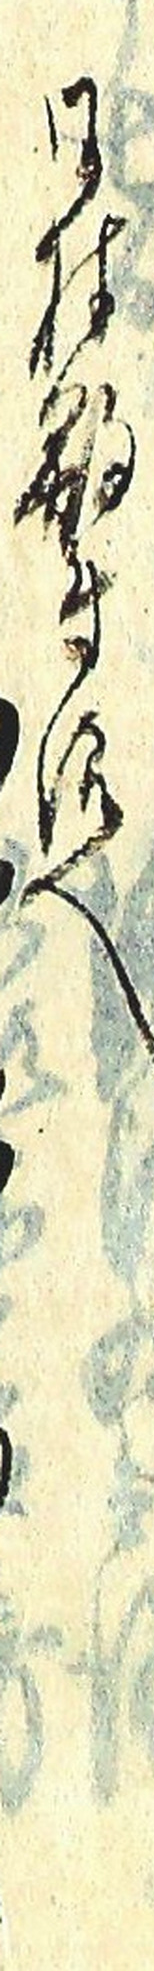同村郡付浪人
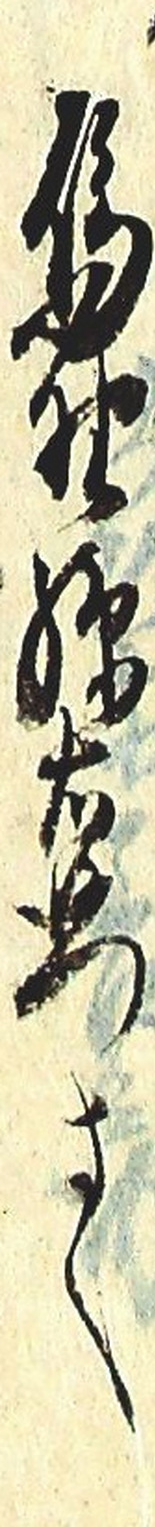鷹野孫右衛門方へ
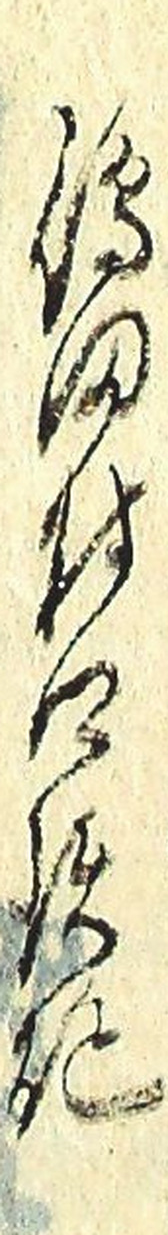島田村郷鉄砲
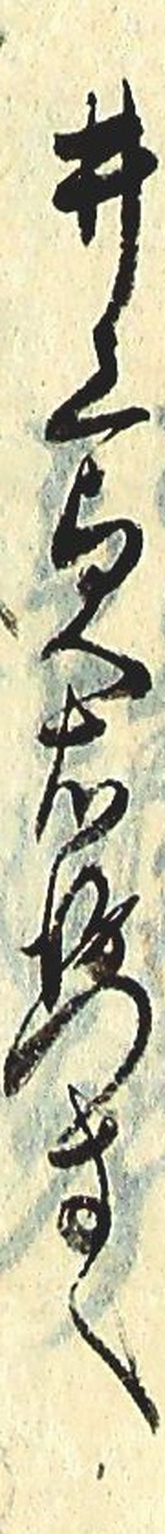井上貞右衛門方へ
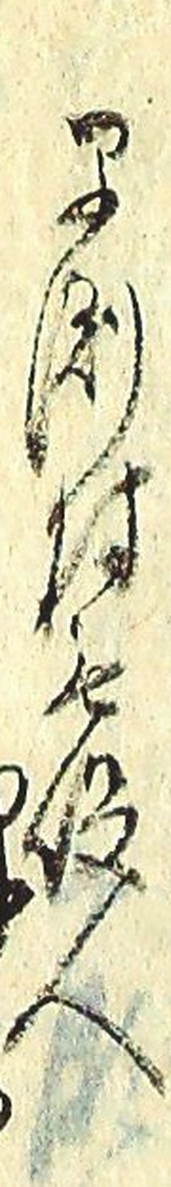早渕村無役人
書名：諸御願書控(弐番）
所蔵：鳴門教育大学 Naruto University of Education
